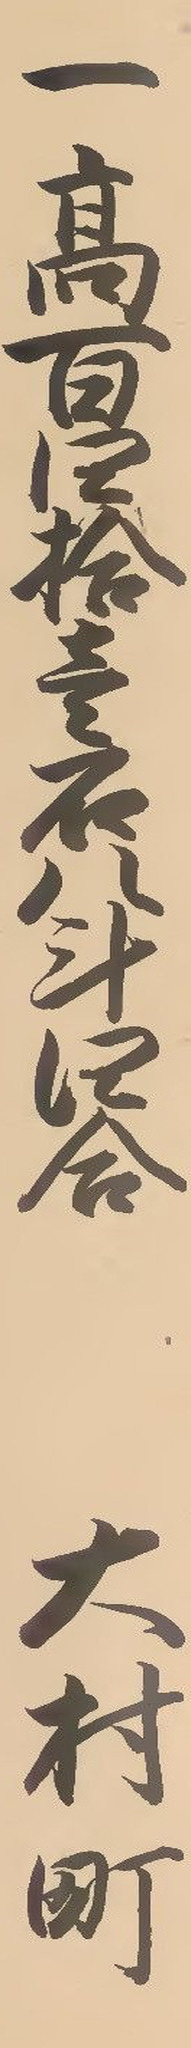一髙百四拾壱石八斗四合大村町
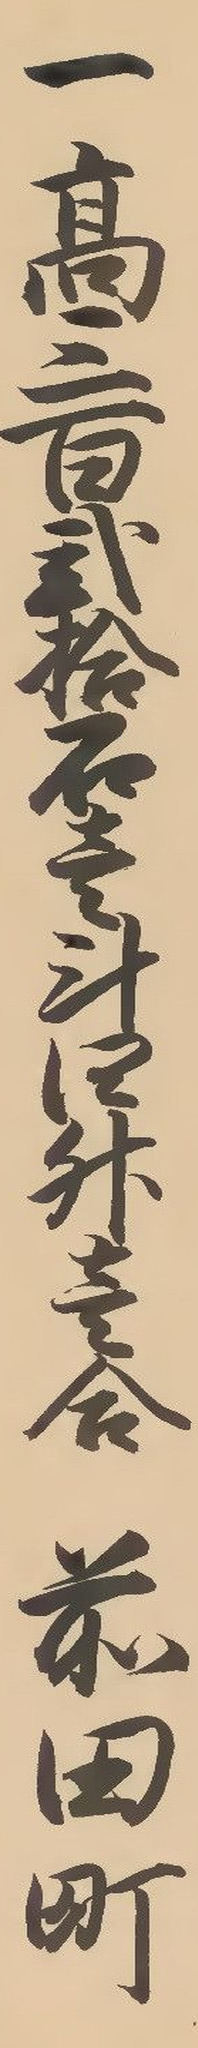一髙三百弐拾石壱斗四升壱合前田町
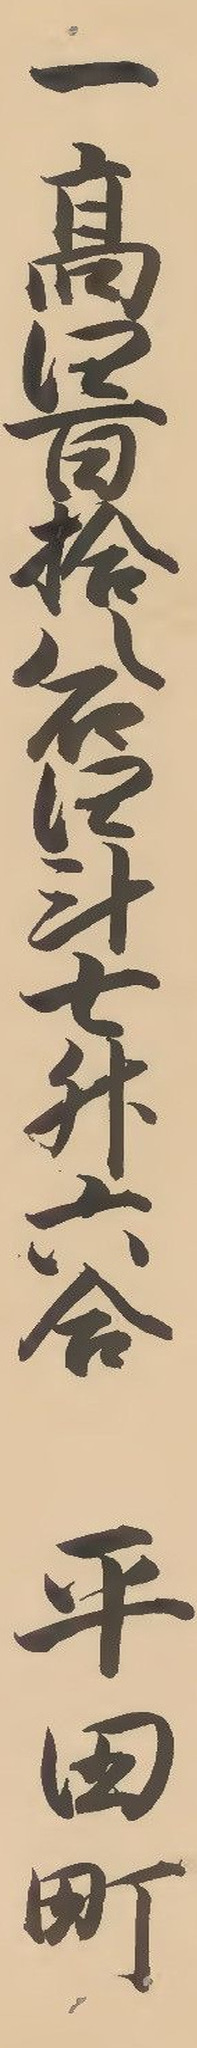一髙四百拾八石四斗七升六合平田町
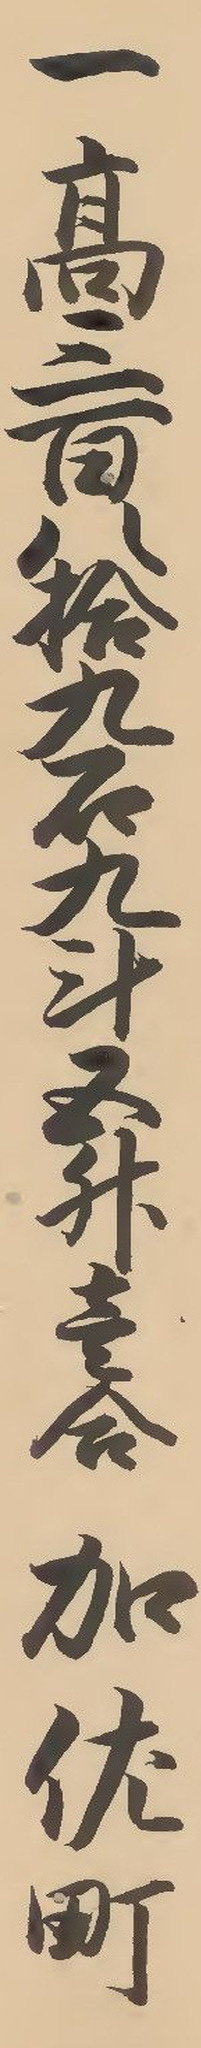一髙三百八拾九石九斗五升壱合加佐町

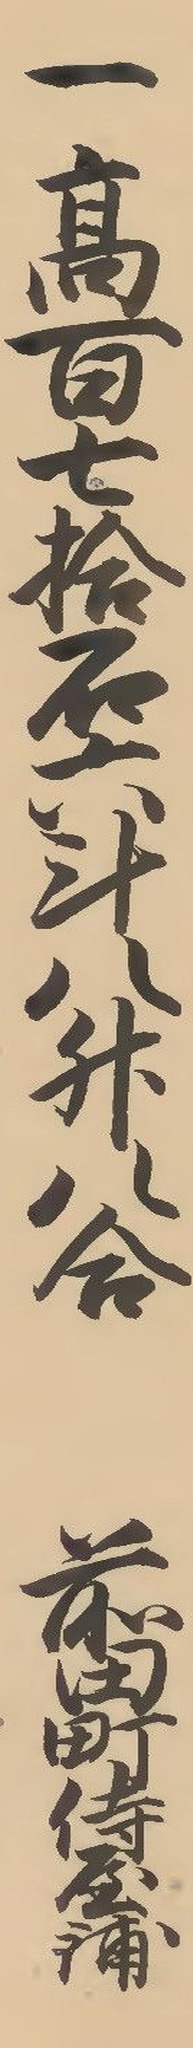一髙百七拾石六斗八升八合前田町侍屋鋪
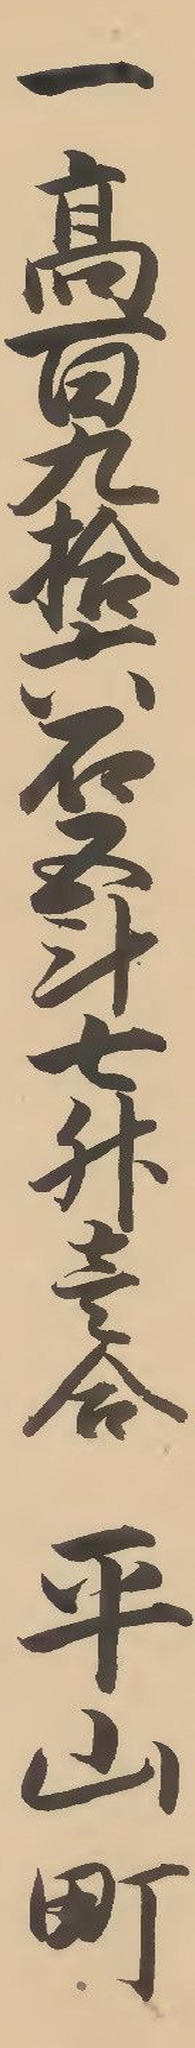一髙百九拾六石五斗七升壱合平山町
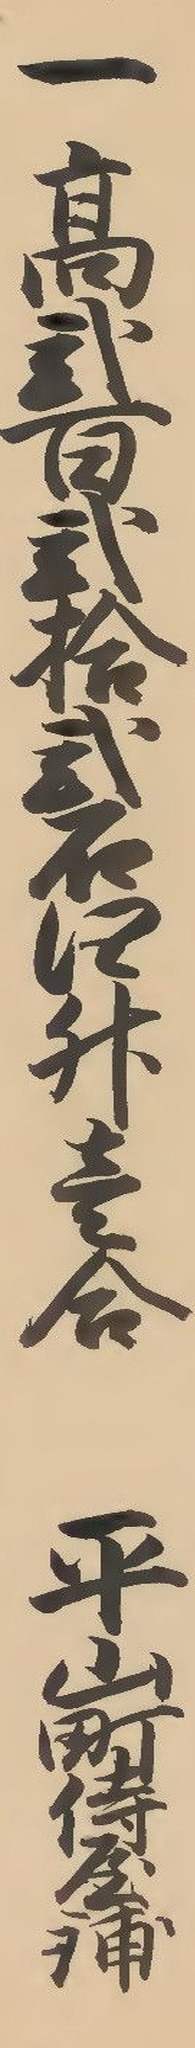一髙弐百弐拾弐石四升壱合平山町侍屋鋪
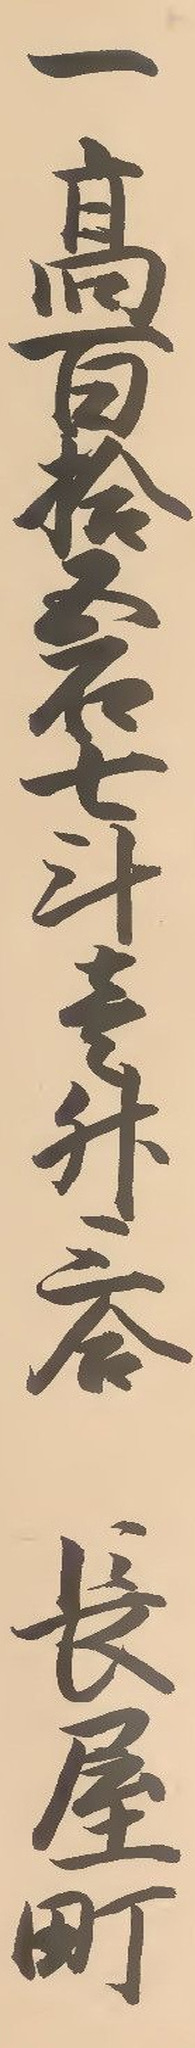一髙百拾五石七斗壱升三合長屋町
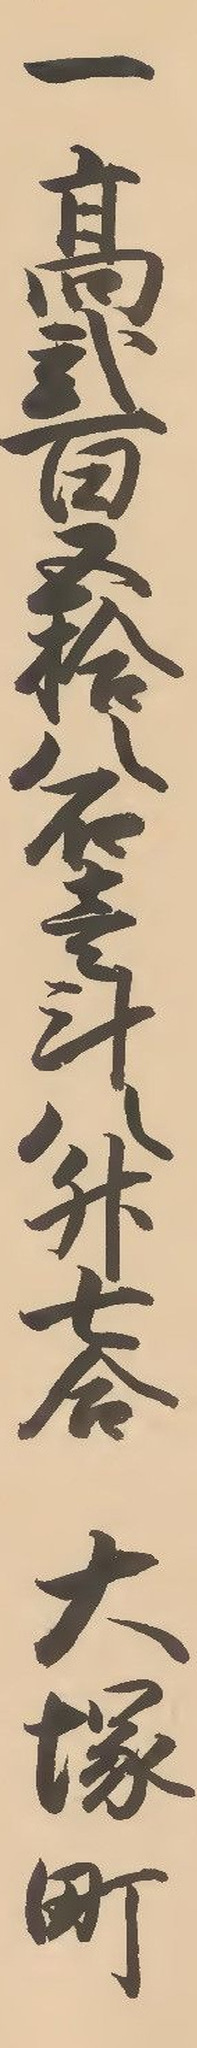一髙弐百五拾八石壱斗八升七合大塚町
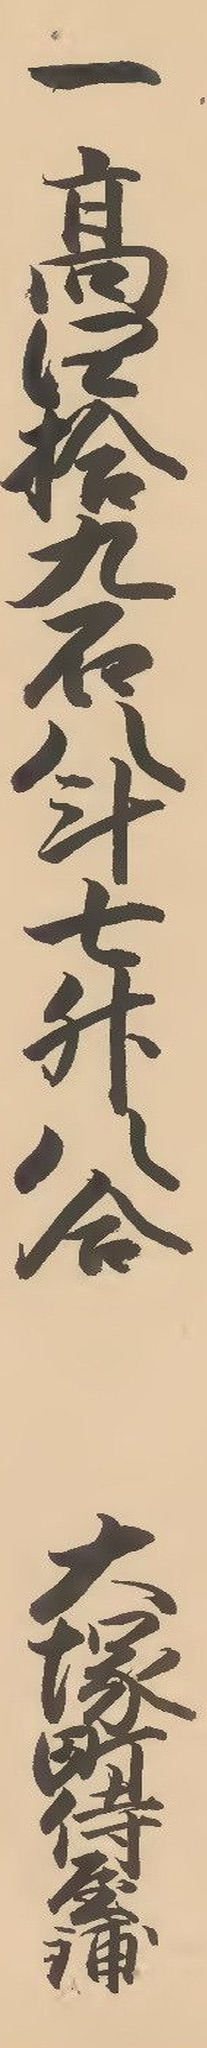一髙四拾九石八斗七升八合大塚町侍屋鋪
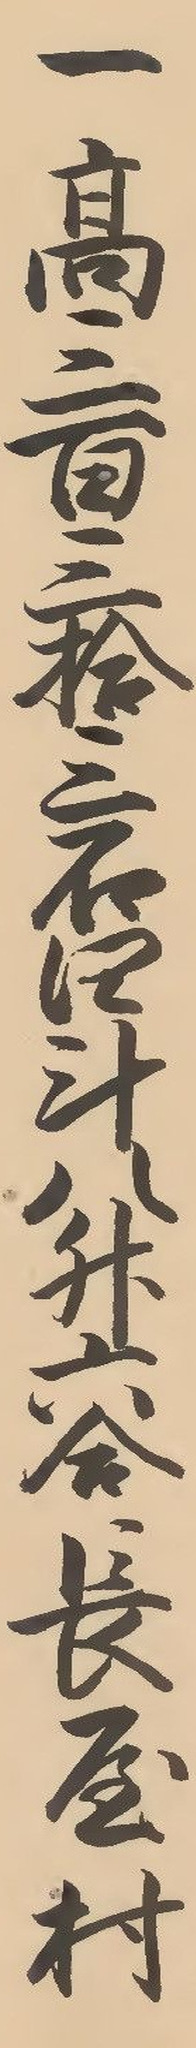一髙三百三拾三石四斗八升六合長屋村

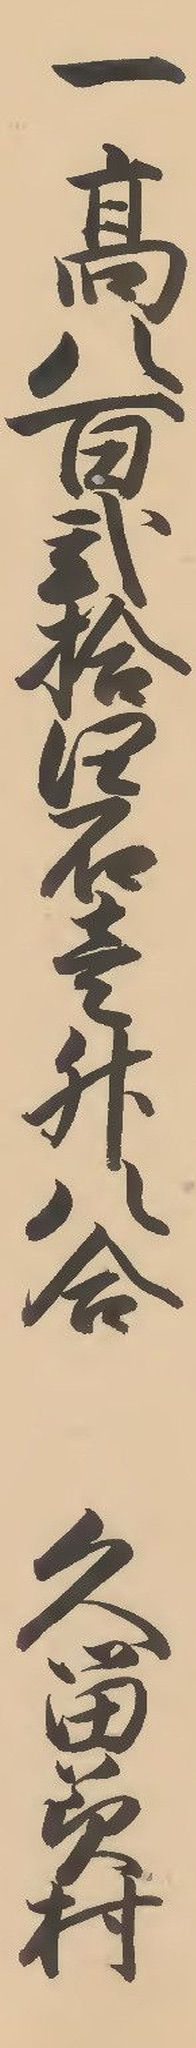一髙八百弐拾四石壱升八合久留美村
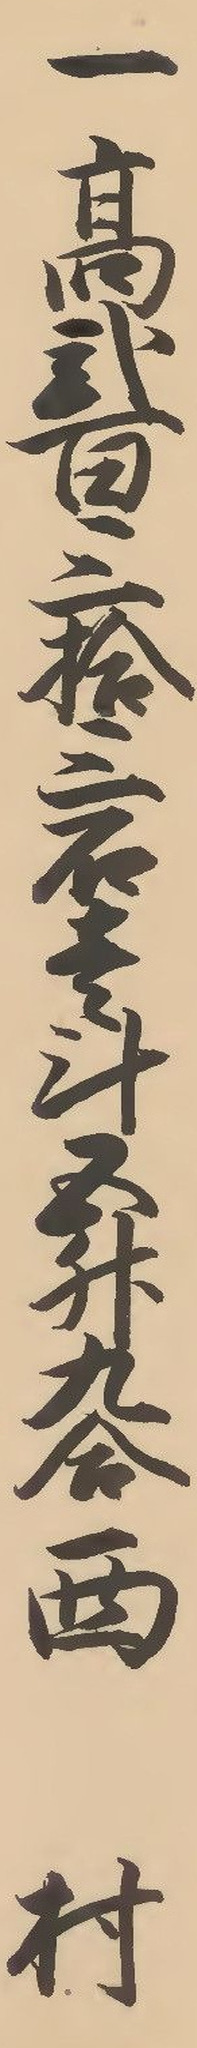一髙弐百三拾三石壱斗五升九合西村
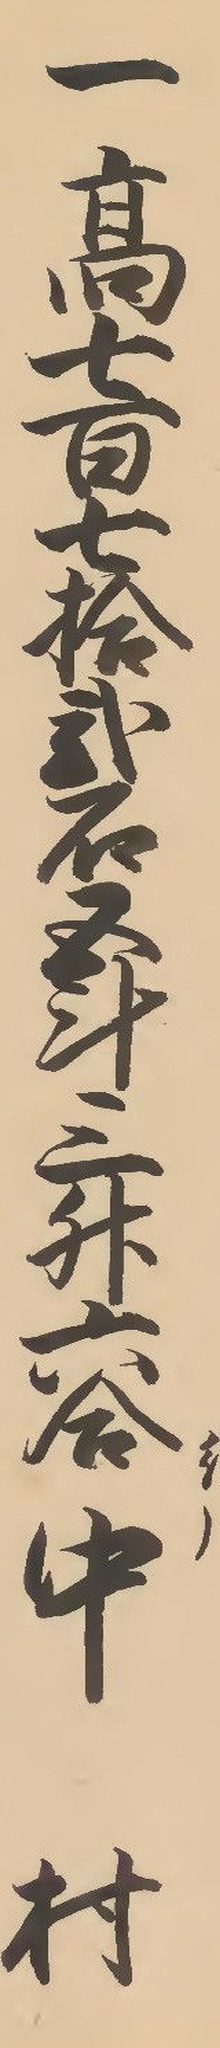一髙七百七拾弐石五斗三升六合中村
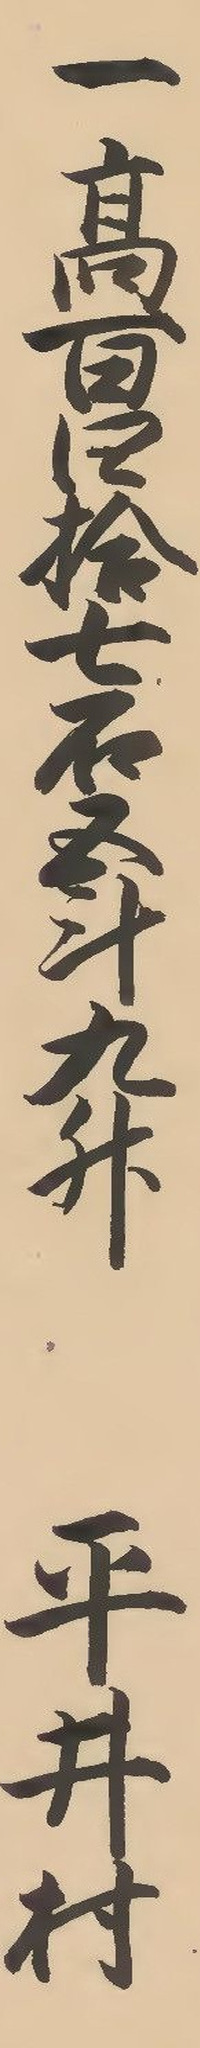一髙百四拾七石五斗九升平井村
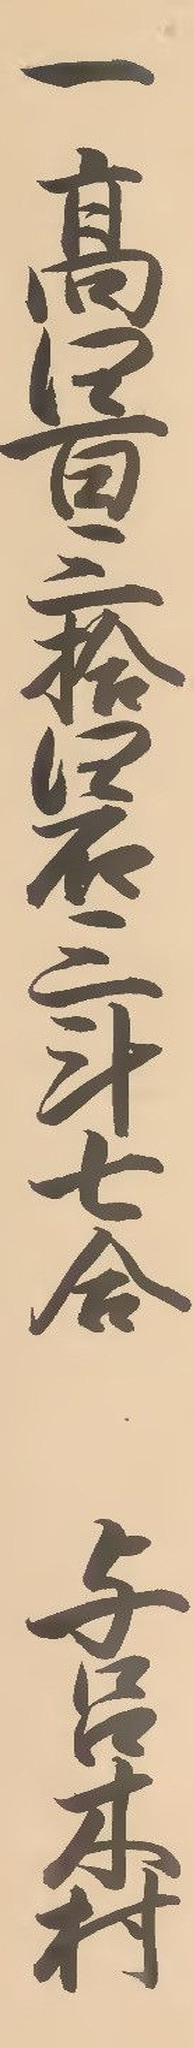一髙四百三拾四石三斗七合与呂木村
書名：播磨国郷帳
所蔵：国立公文書館 National Archives of Japan
